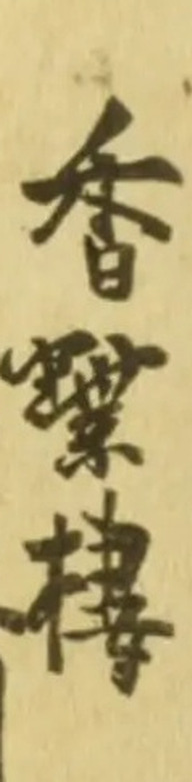香蝶楼
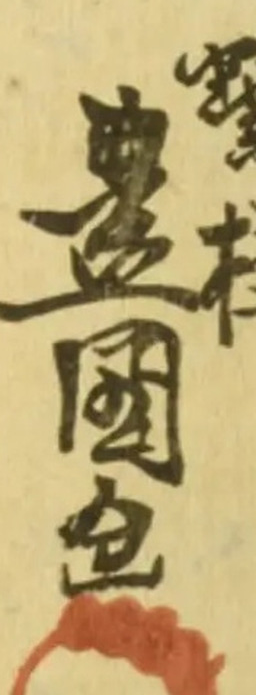豊国画
